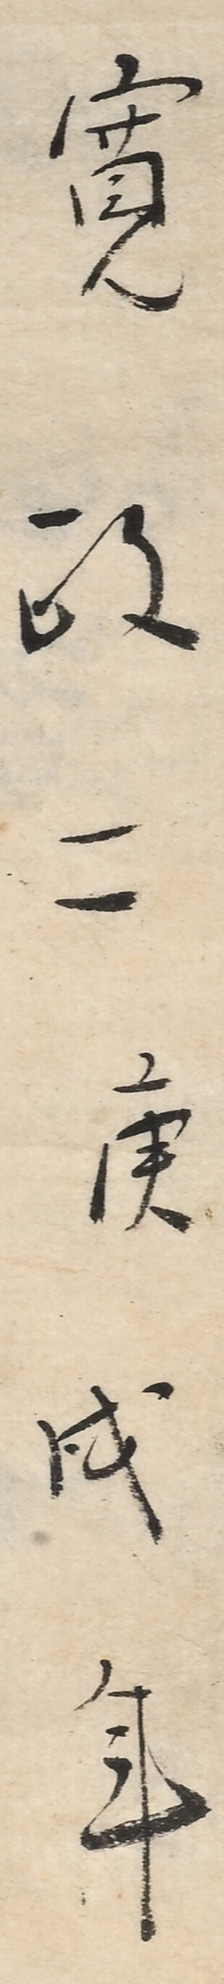寛政二庚戌年
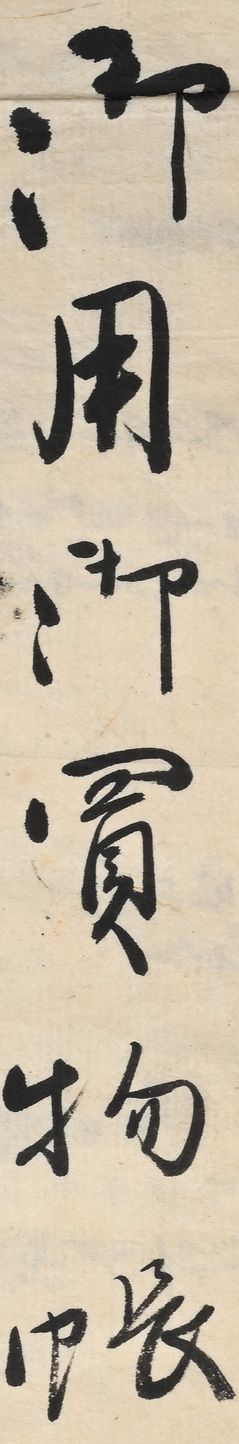御用御買物帳
